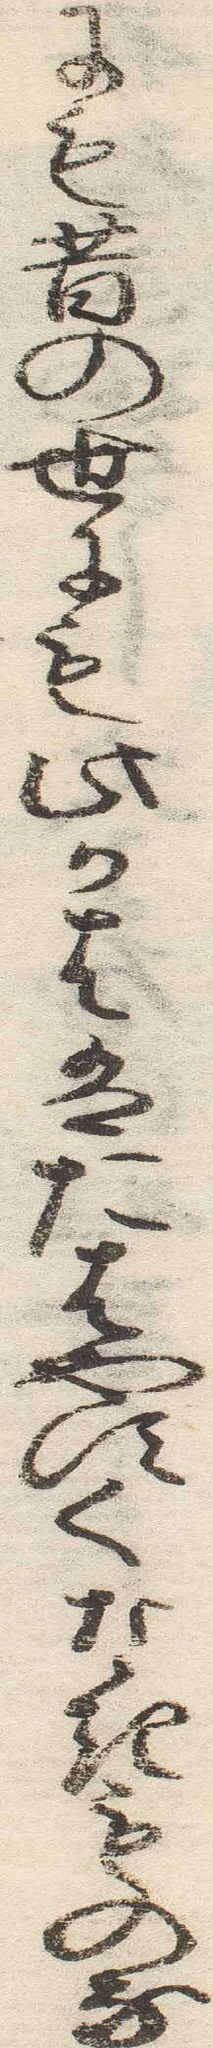にも昔の世にも此かははたはやすくなきものな
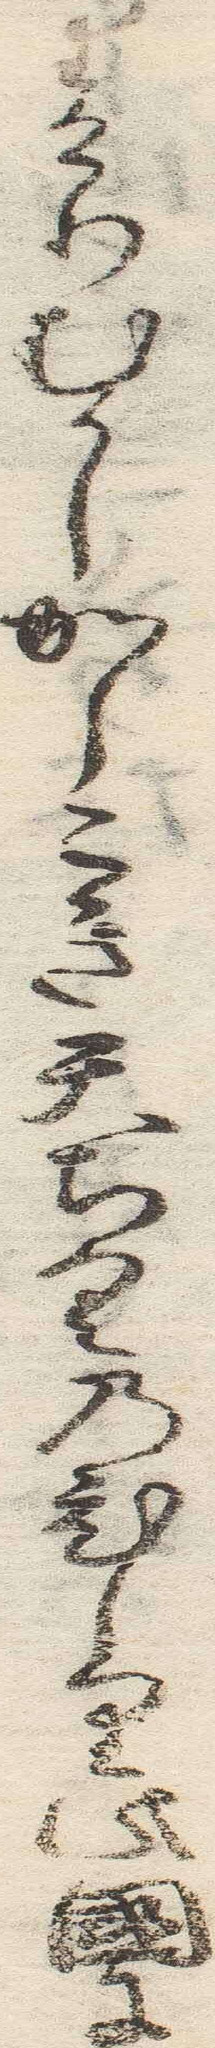りけりむかしかしこき天ちくのひしり此国に
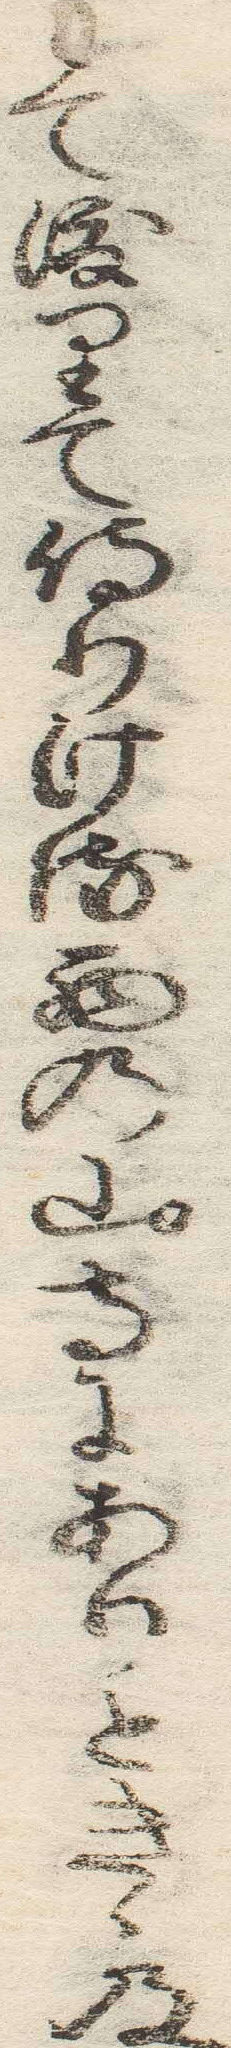もて渡りて侍りける西の山寺にありときゝ及
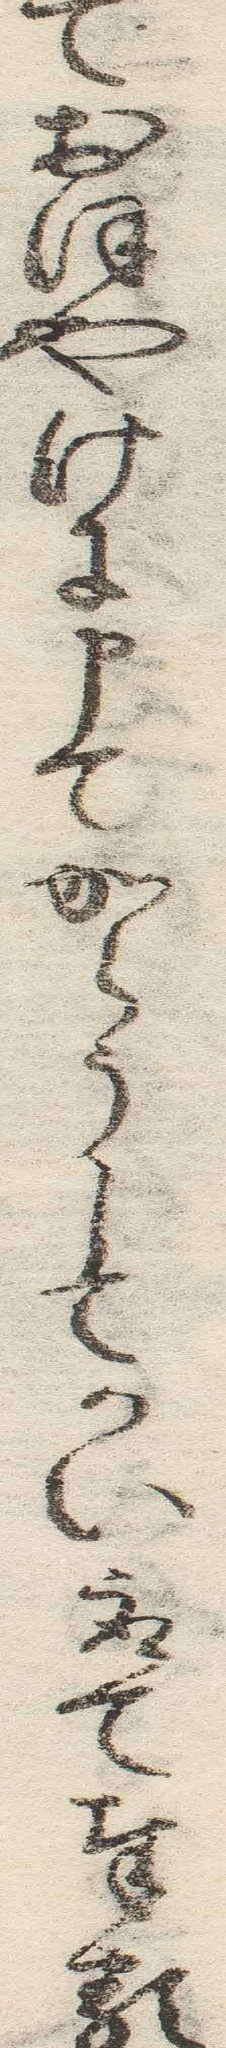ておほやけに申てからうしてかい取て奉る
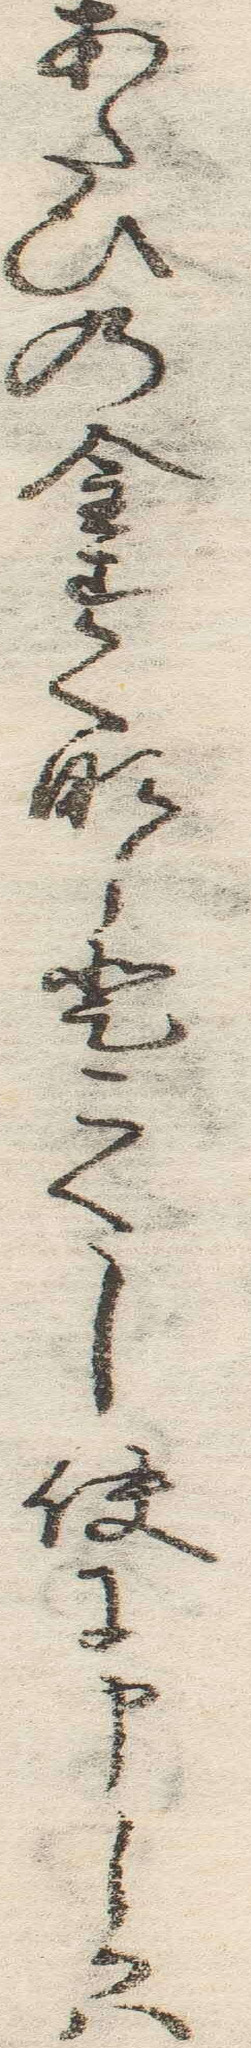あたひの金すくなしとこくし使に申しかは
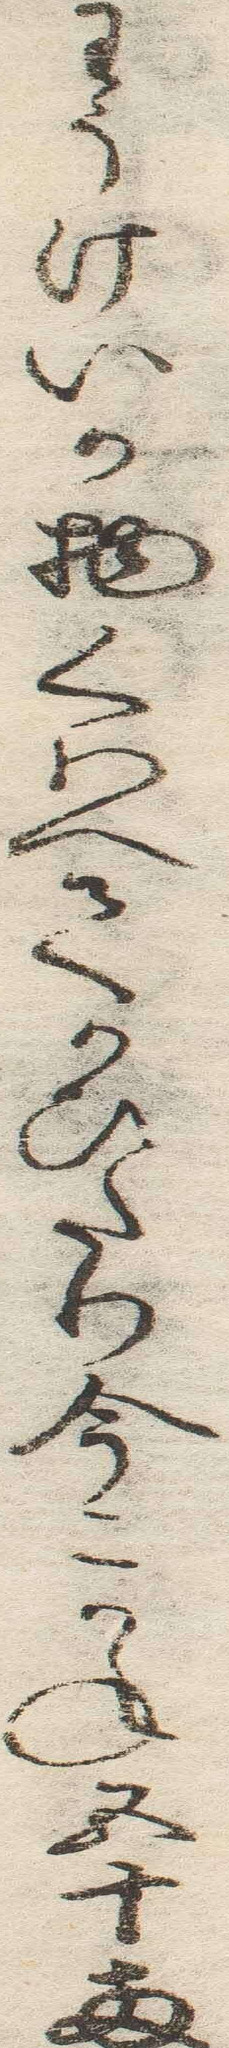わうけいか物くはへてかひたり今こかね五十両
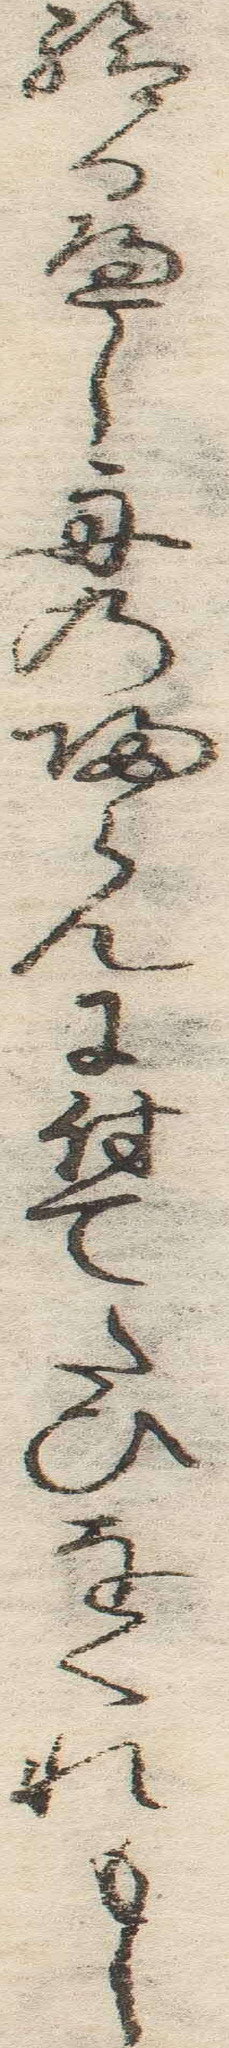給るへし舟の帰らんに付てたひをくれもし
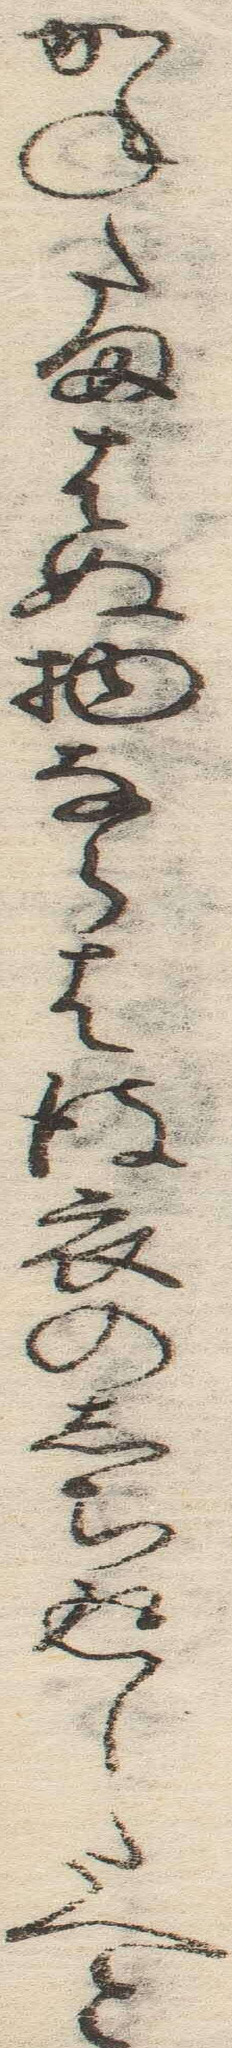かねたまはぬ物ならは彼衣のしち返したへと

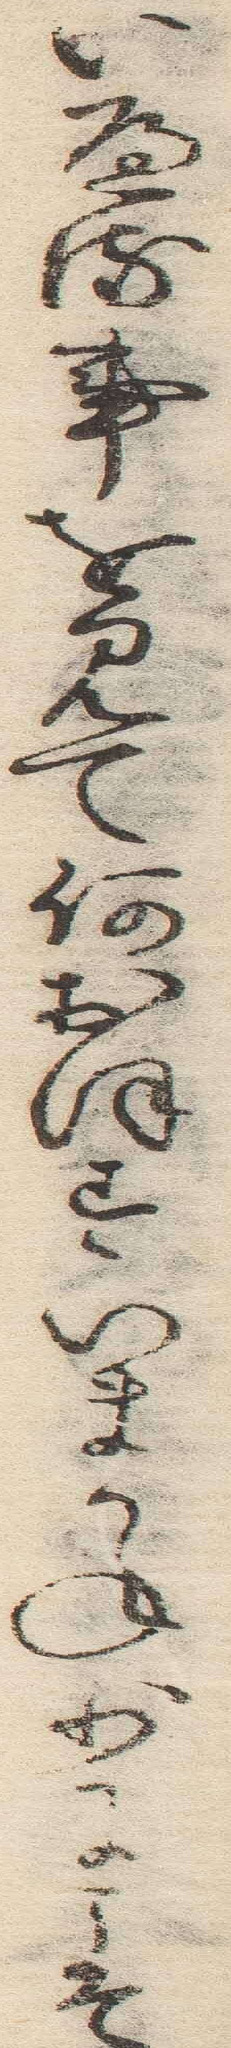いへる事を見て何おほすいまかね少にこそ
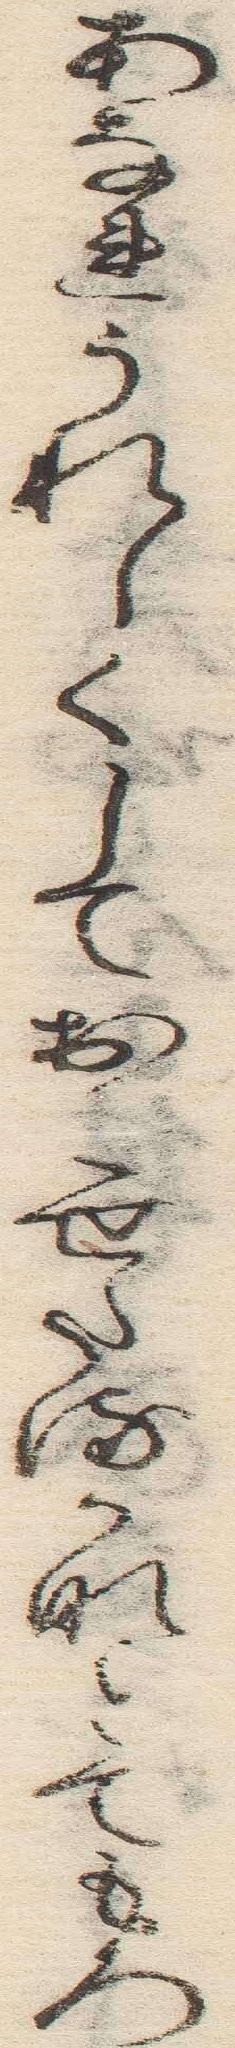あなれうれしくしておこせるかなとてもろ
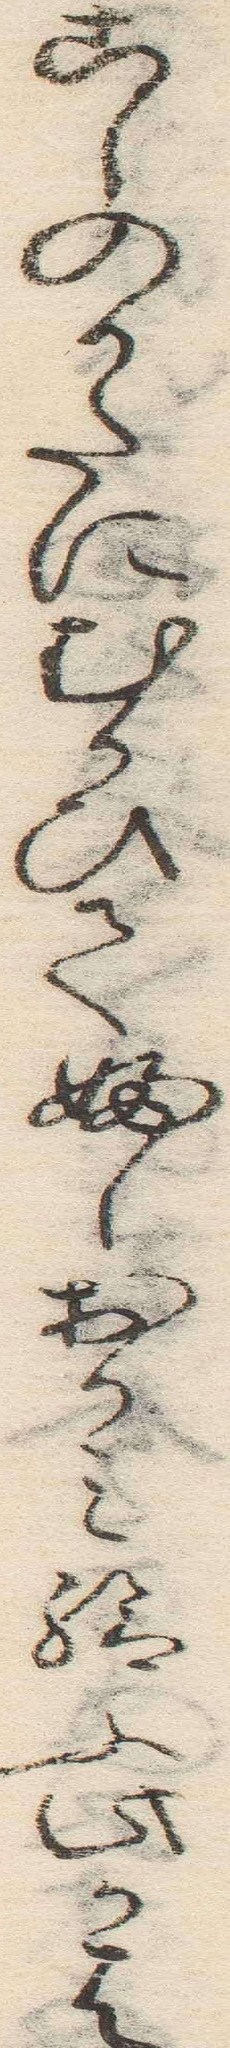こしのかたにむかひてふしおかみ給ふ此かは
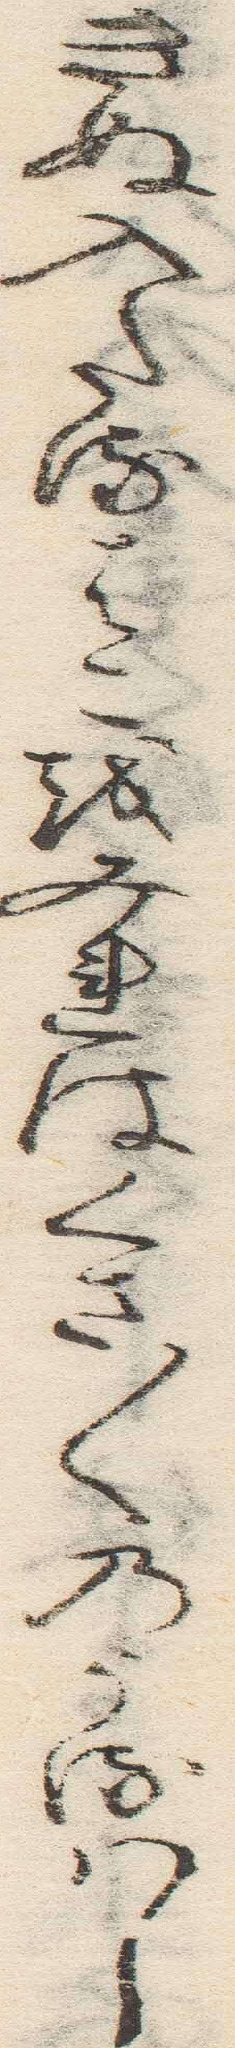きぬ入たるはこをみれはくさ〳〵のうるはし
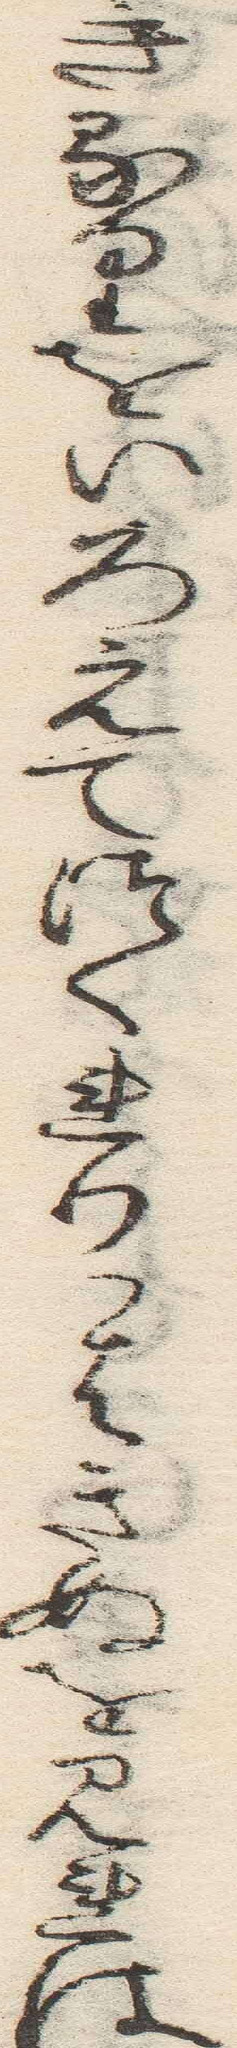きるりをいろえてつくれりかはきぬを見れは
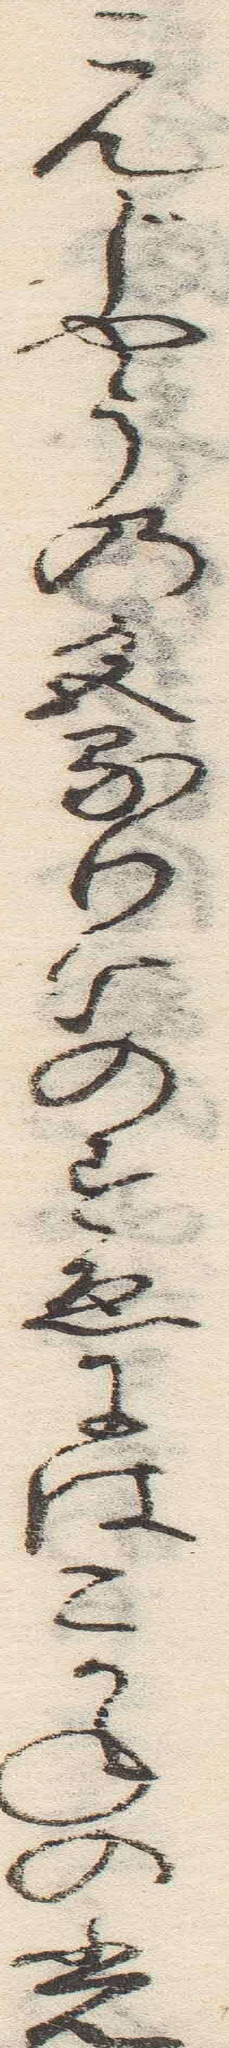こんじやうの色るりけのすゑにはこかねの光
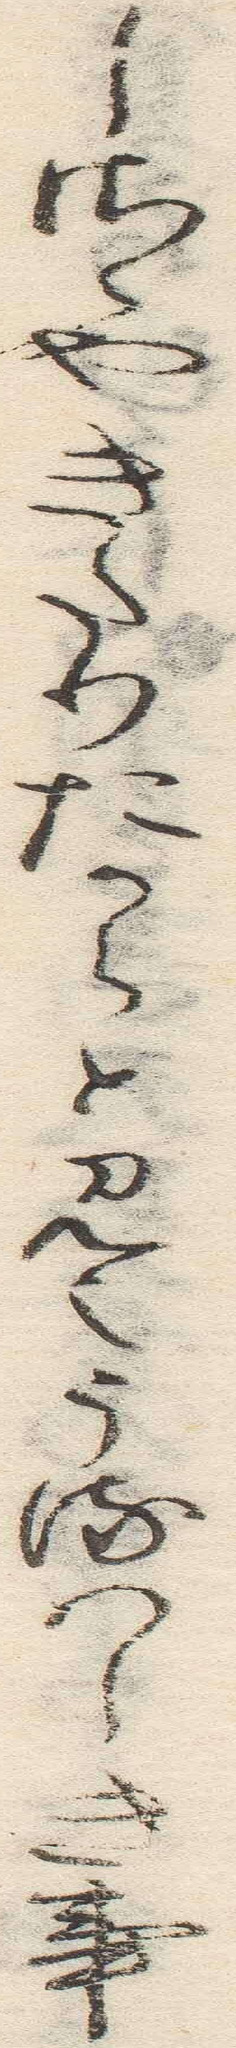しさゝやきたりたからと見えうるはしき事
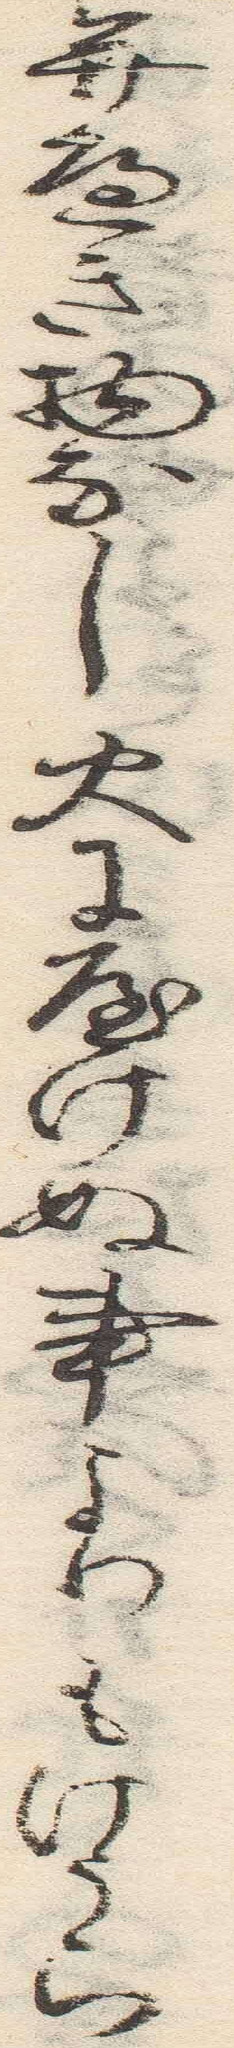並へき物なし火にやけぬ事よりもけうら
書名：竹取物語
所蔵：東京学芸大学附属図書館 国文学研究資料館
